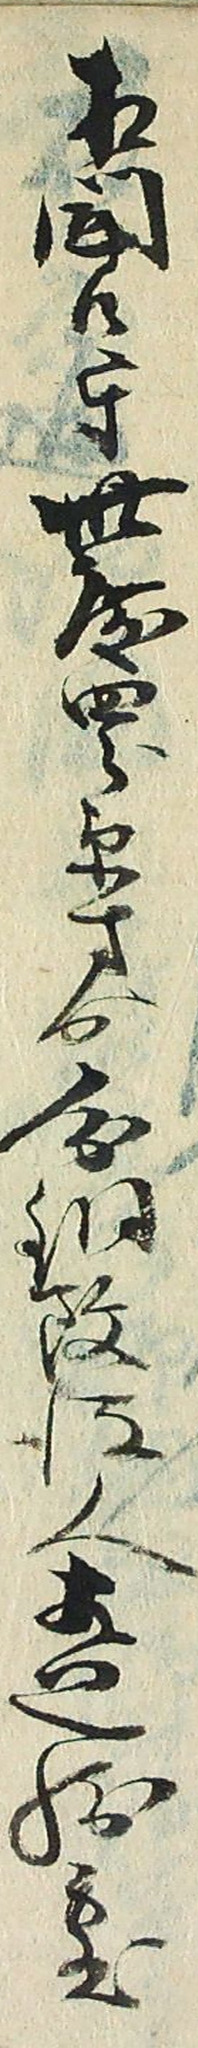相聞候に付此度四郎兵方ゟ分銅改役人相廻紛敷
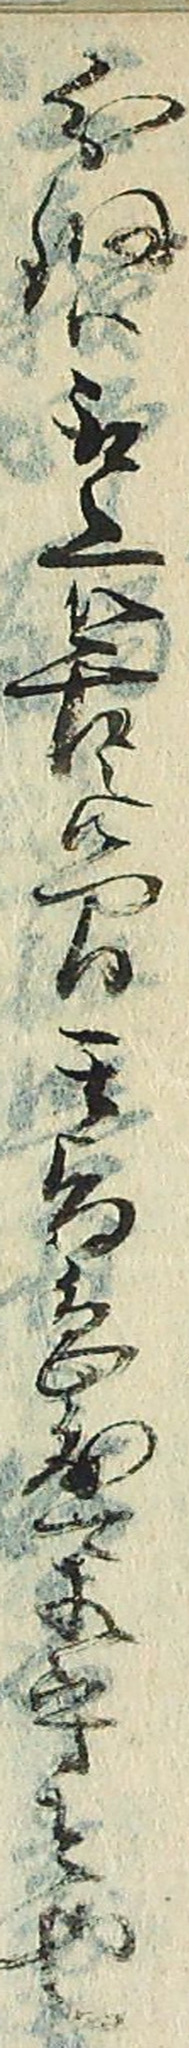分銅は取上筈に候間其旨急度可守者也
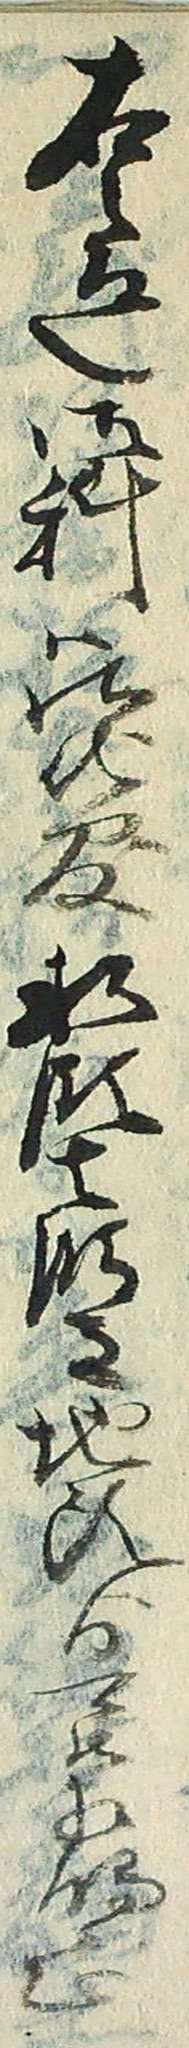右之通御料は御代官私領者領主地頭ゟ可被相触候以上
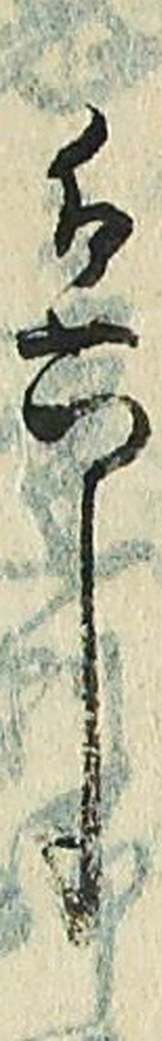卯六月
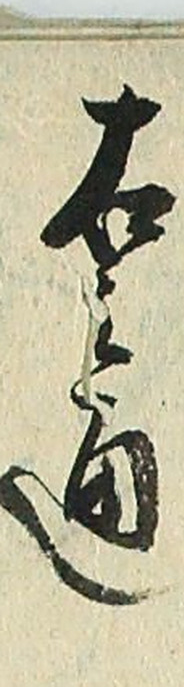右之通
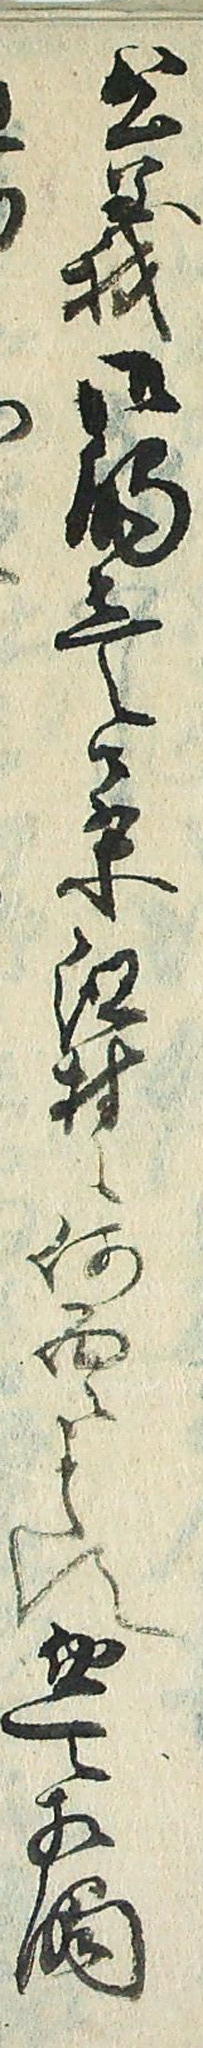公儀御触有之候条組村々何者によらす逸〻相触
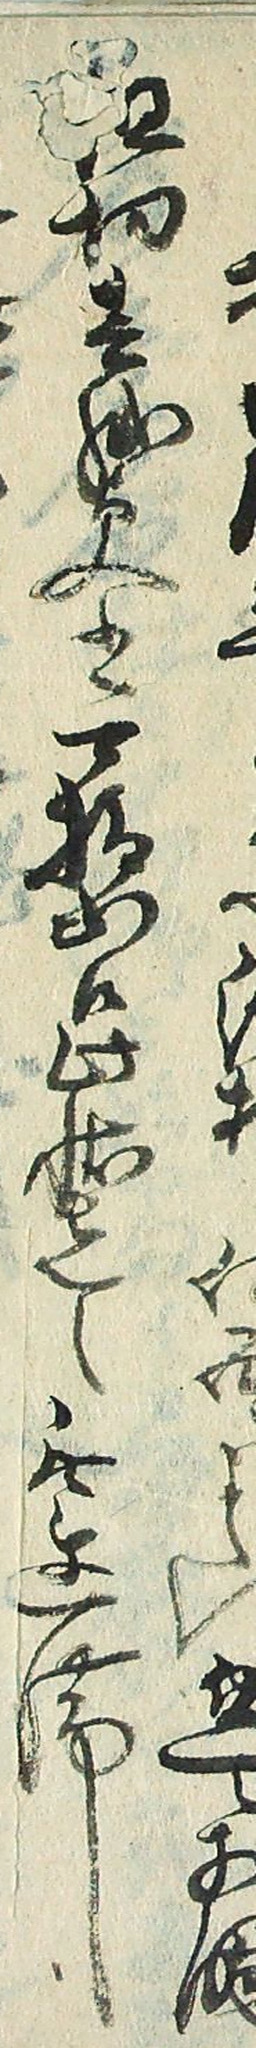組切壱紙受書可指出候此状先々無遅滞
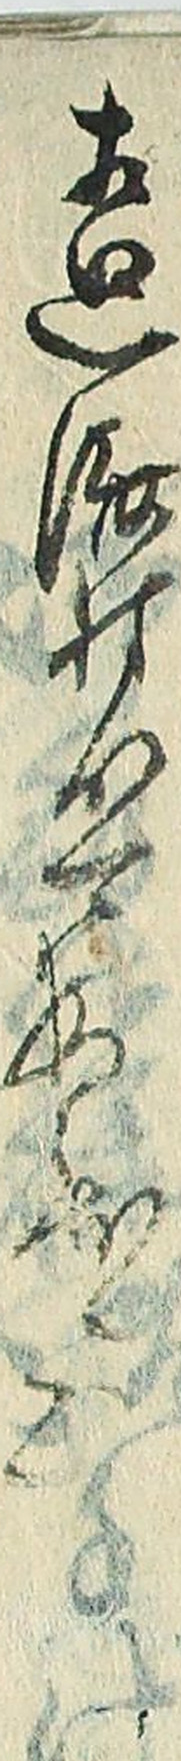相廻済村ゟ可指戻候以上
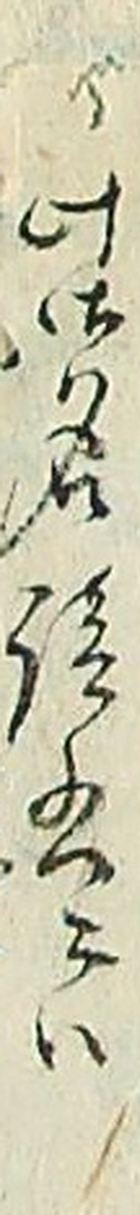此御名請書には
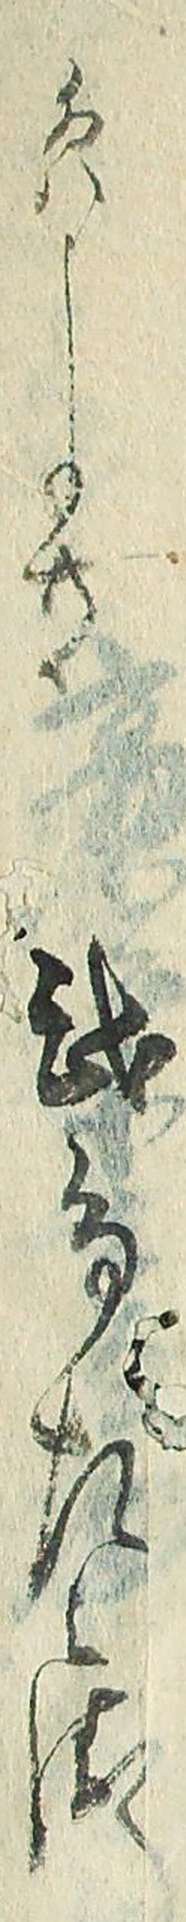卯八月廿日武鳥左兵衛

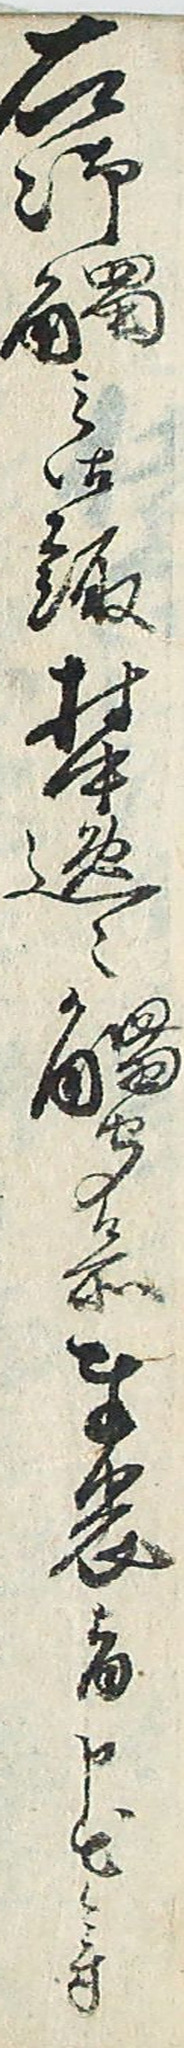右御触之御趣村中逸々触聞奉畏旨申出候に付
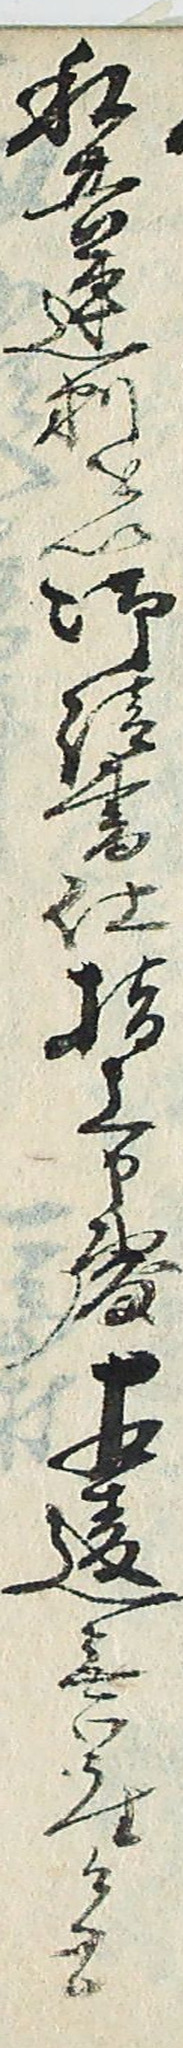私共連判を以御請書仕指上申処相違無御坐候以上
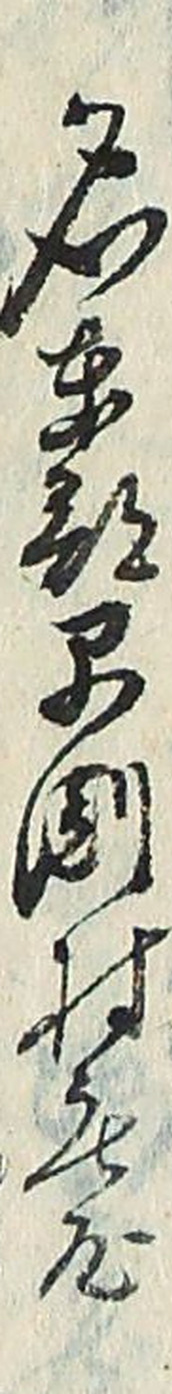名東郡早渕村庄屋
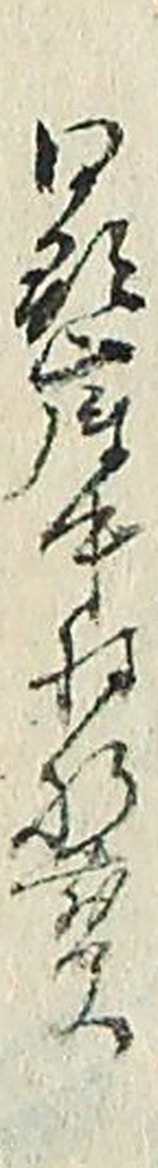同郡府中村肝煎
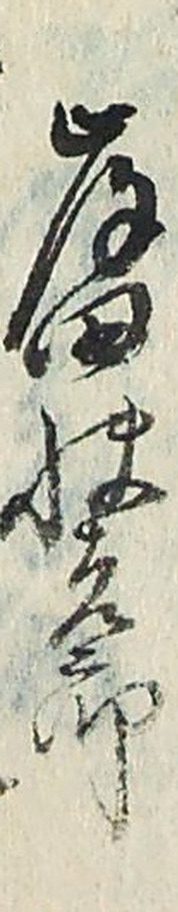岸田快吉郎
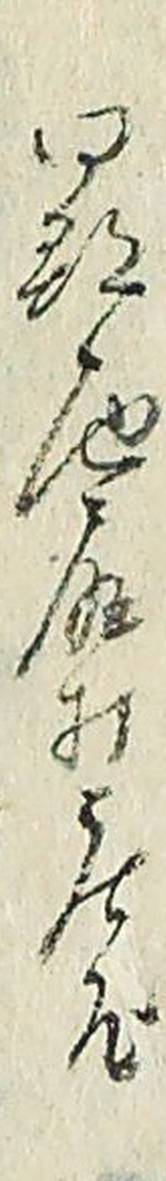同郡池尻村庄屋
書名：諸御用御□受書控
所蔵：鳴門教育大学 Naruto University of Education
